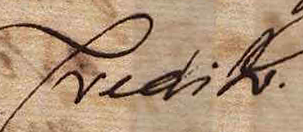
Credito.
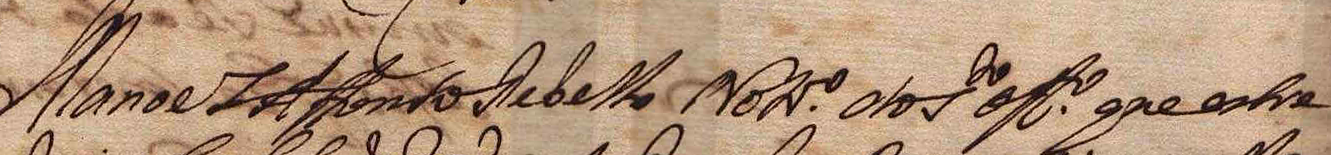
Manoel Affonso Rebello Notr.o do sto off.o que esCr
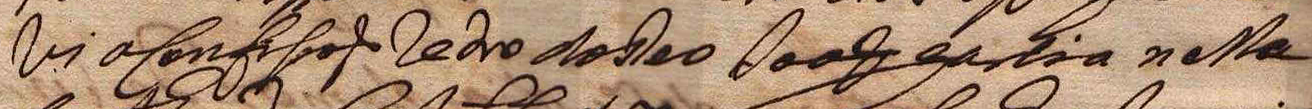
vi a Confissaõ Retro do Reo Ioaõ garcia nella
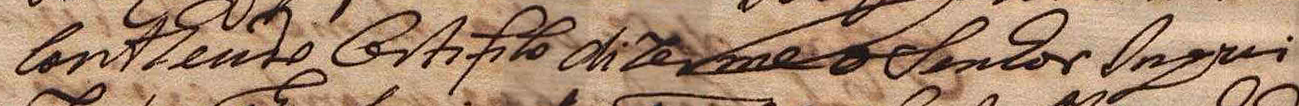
Contheudo Certifico dizerme o Senhor Inqui
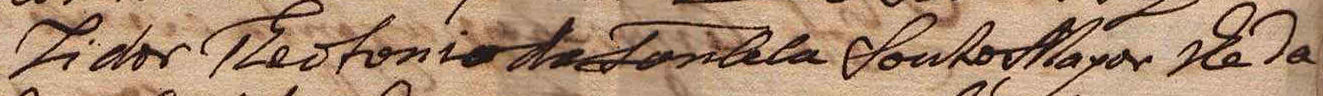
Zidor Theotonio da Fonseca Souto Mayor lhe da
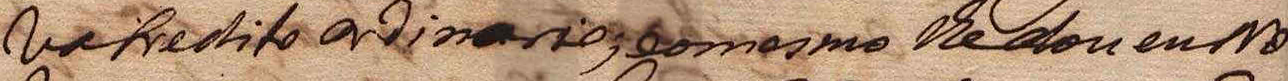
va Credito ordinario, e o mesmo lhe dou eu No
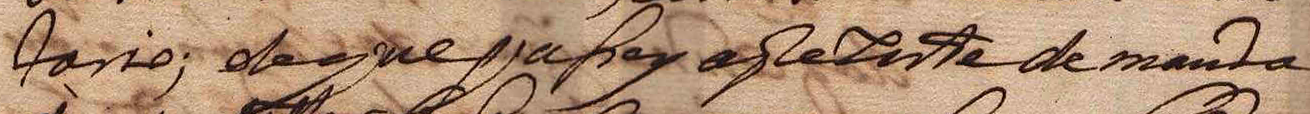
tario; de que passey a pRezente de manda
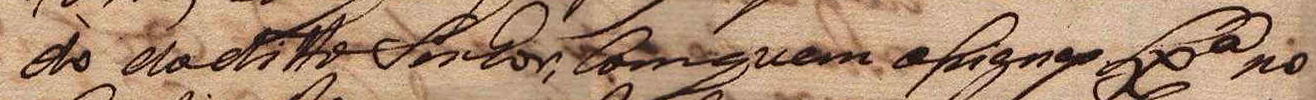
do do ditto Senhor, com quem assignej Lxa no
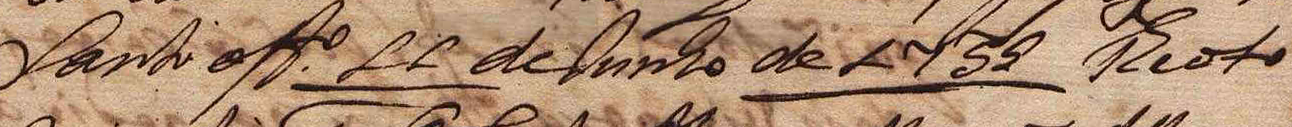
Santo off.o 11 de Iunho de 1735 Theoto
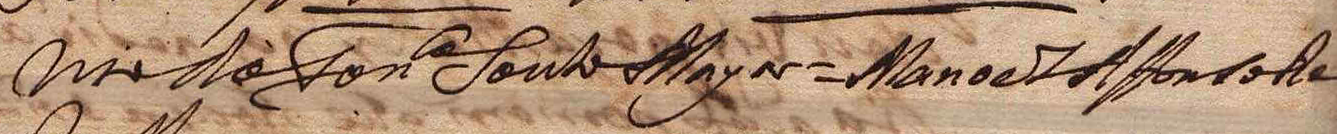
nio da Fonca Souto Mayor = Manoel Affonso Re
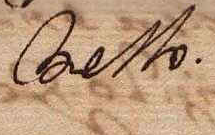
bello.
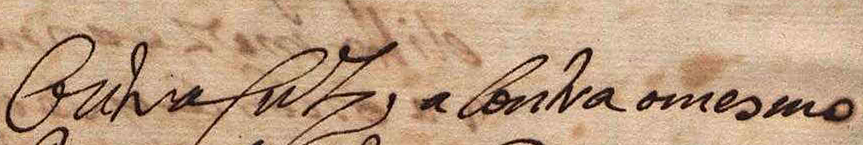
Outra Culpa Contra o mesmo
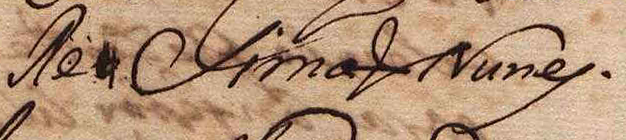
Ree Simaõ Nunes.
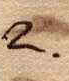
2.
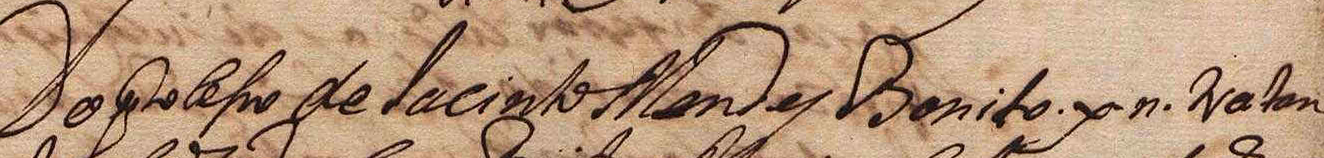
Do pRoCesso de Iacinto Mendes Bonito. x n. tratan
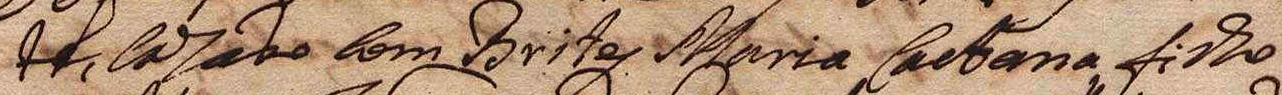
te cazado com Brites Maria Caetana filho
